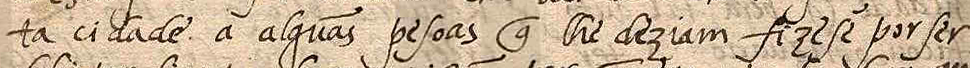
ta cidade a alguās pesoas q̄ lhe deziam fizese por ser
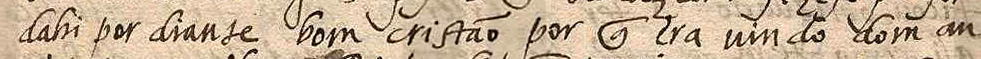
dahi por diante bom cristão porq̄ era uindo dom an
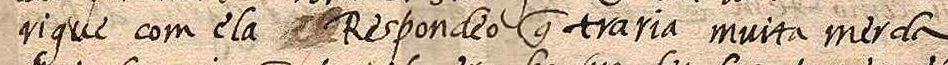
rique com ela Respondeo q̄ traria muita merda
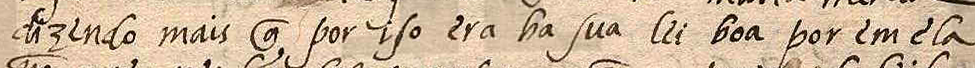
dizendo mais q̄ por iso era ha sua lei boa por em ela
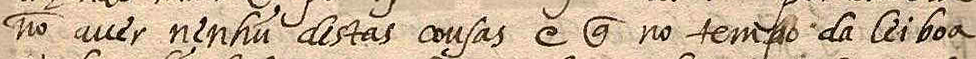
n̄o auer nenhū destas cousas e q̄ no tempo da lei boa
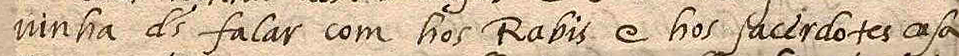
uinha ds̄ falar com hos Rabis e hos sacerdotes casa
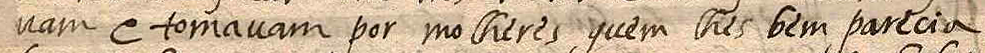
uam e tomauam por molheres quem lhes bem parecia
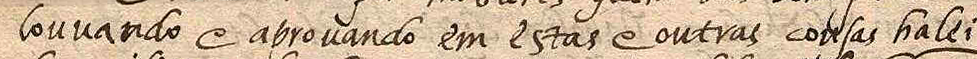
louuando e aprouando em estas e outras cousas ha lei
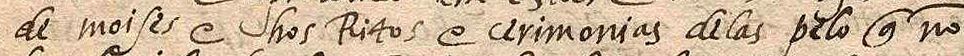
de moises e os Ritos e cerimonias delas pelo q̄ nō
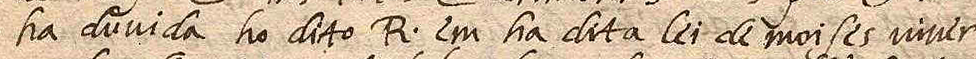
ha duuida ho dito R. em ha dita lei de moises uiuer
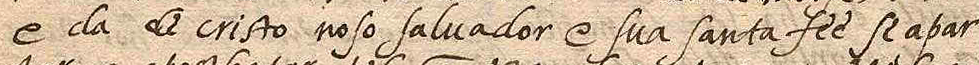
e da de cristo noso saluador e sua santa fee se apar
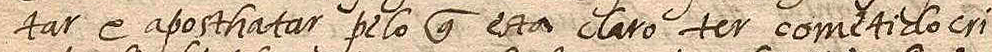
tar e aposthatar pelo q̄ esta claro ter cometido cri
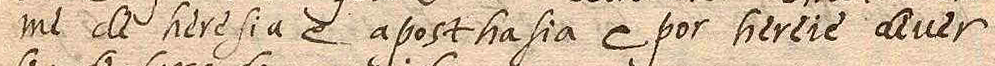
me de heresia e aposthasia e por hereie deuer
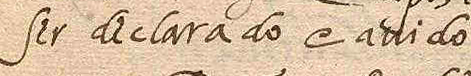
ser declarado e auido
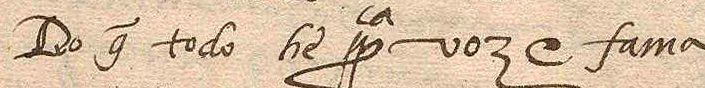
Do q̄ todo he ꝓpca voz e fama
